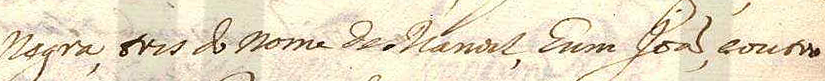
negra, tres do nome de Manoel, hum Joaõ, e outro
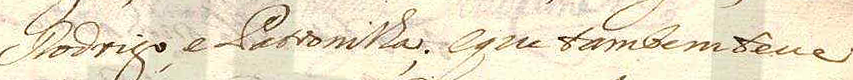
Rodrigo, e Petronilha, e que tambem teue
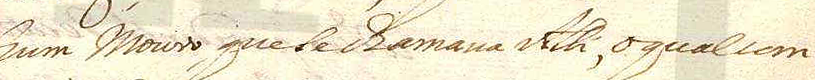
hum Mouro, que se chama Alli, o qual com
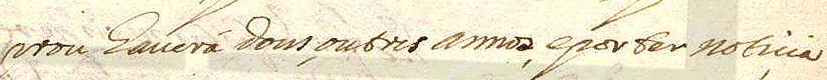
prou hauerá dous, ou tres annos, e por ter notiçia
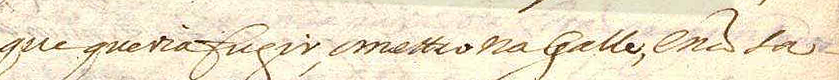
que queria fugir, o metteo na Galle, e naõ sa
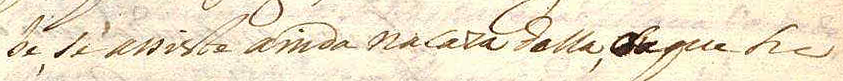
be, se assiste ainda na caza della, ou que he
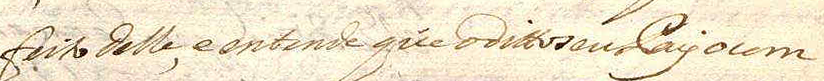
feito delle, e entende que o ditto seu Pay o com
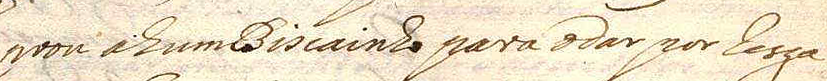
prou a hum Biscainho para o dar por Resga
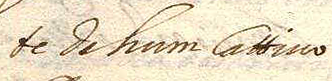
te de hum Cattiuo
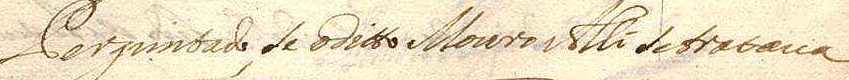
Perguntado, se o ditto Mouro Alli se trataua
